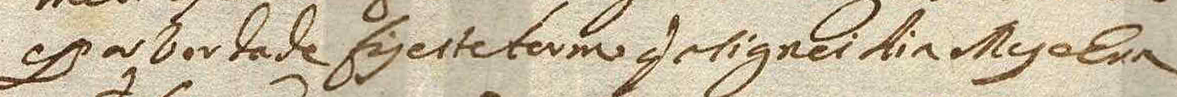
e por verdade fizeste termo q̄ asignei dia Mes e Era
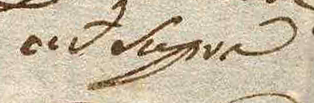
ut Supra
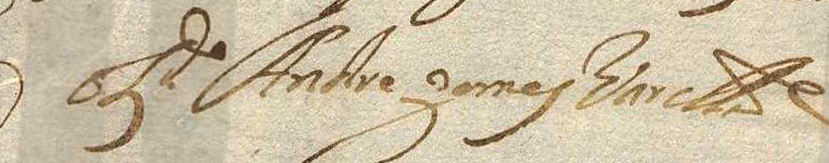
O L.do Andre gomes Varella
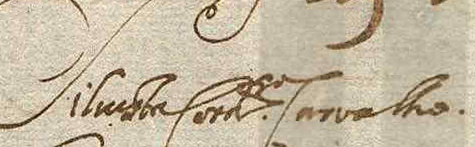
Siluesta Cord.ro Carvalho.
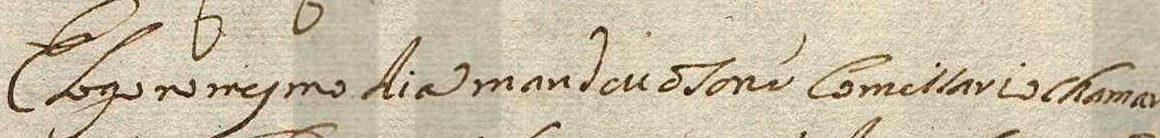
E logo no mesmo dia mandou o Senr Comissario chamar
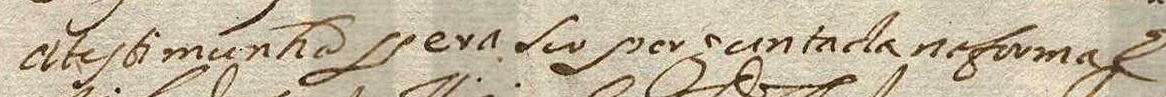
a testimunha pera ser perguntada na forma e
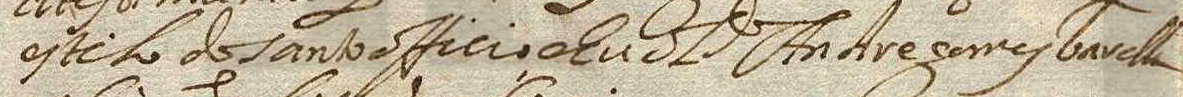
estilo do santo officio, e Eu o Ldo Andre gomes Varella
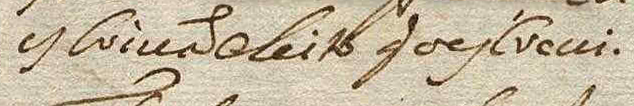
esCriuã eleito q̄ o esCreui.
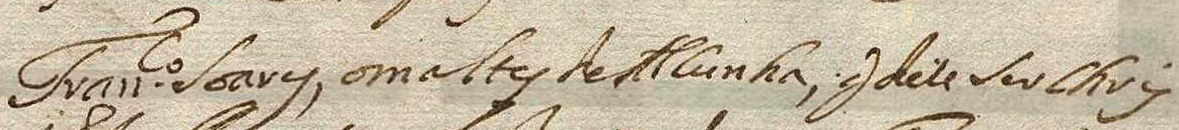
Fran.co Soares, o maltes de AlCunha, q̄ dise ser chris
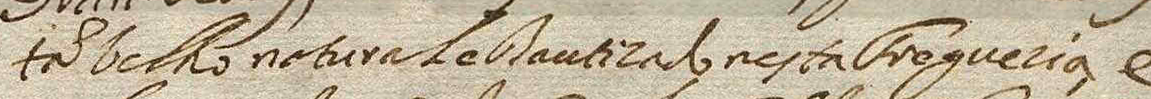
taõ velho natural e Bautizado nesta Freguezia, e
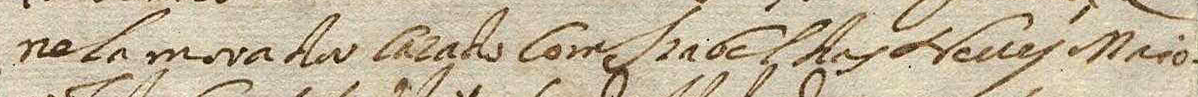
nela morador Cazado Com Jzabel das Neues Maio
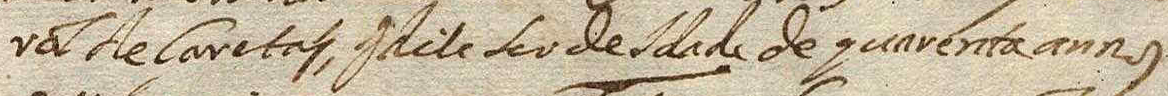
rol de Caretas, q̄ dise ser de Idade de quarenta annos
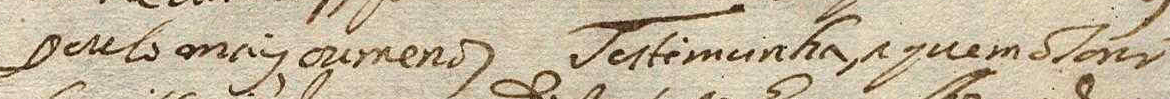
pouCo mais, ou menos Testimunha, a quem o Senr
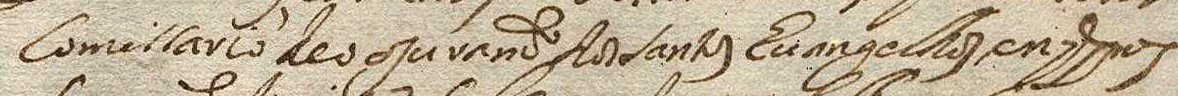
Comissario deo o juramto dos santos Euangelhos, en q̄ pos
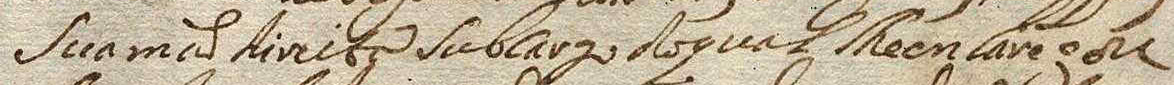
sua maõ direita sub cargo do qual lhe enCaregou
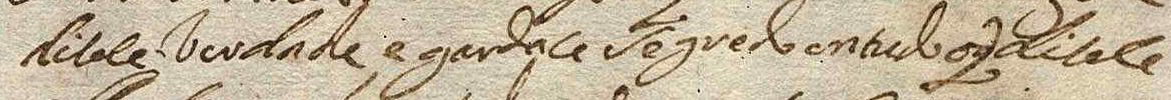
diCeCe Verdade, e gardace segredo entudo o q̄ diseCe
